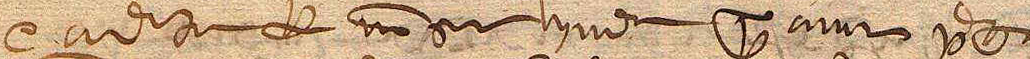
e a dita Re n̄o ser vynda p̄o auer p̄ga
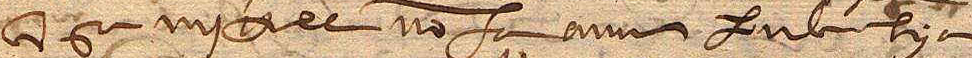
ē samjgell n̄o ha auer honde hya
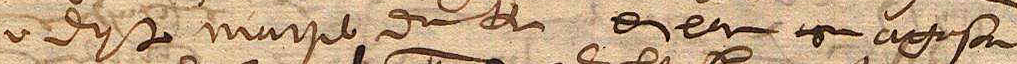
o dyto marjdo da Re e elle se agasta
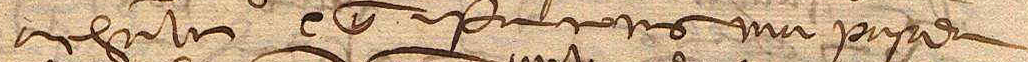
a chave e q̄ esta coresma pasada
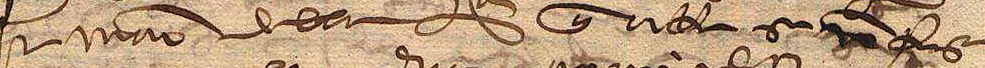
Jrmão della tsa q̄ a Re se c̄ofesa
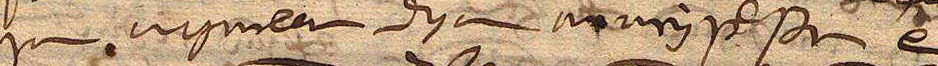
ra aquelle dya ao acyp̄ste e
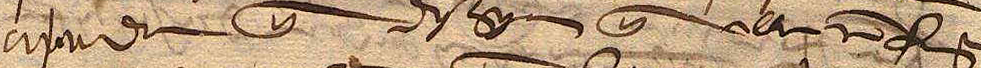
aJnda q̄ dyzya q̄ ella c̄ofesa
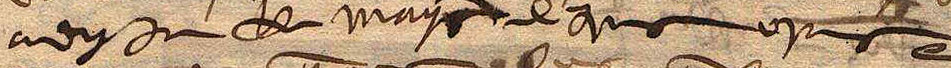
a dyta Re mays de tres oras e
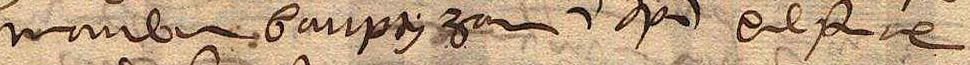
mandou bauptyzar ē tp̄o e deste al
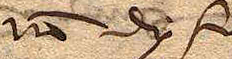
nō dyse
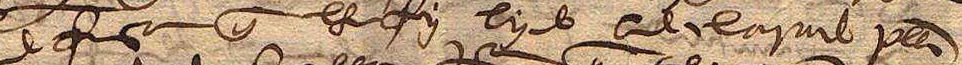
defesa q̄ lhe foy lydo e declarado pl̄lo
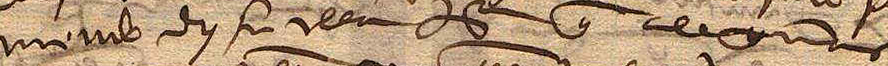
meudo dyse ella tsa q̄ allgūas
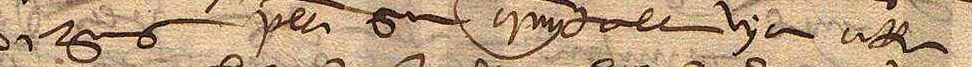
vezes p̄llo seu q̄ujtall vya a Re
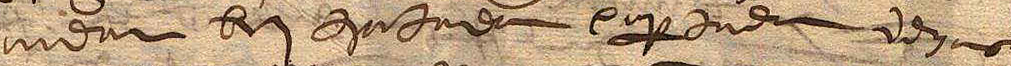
andar bem tratada e aꝑtada ē dyas
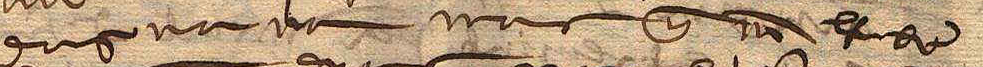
da somana mas q̄ n̄o lhe lē
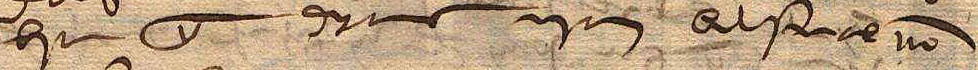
bra q̄ dyas eram e deste al n̄o
